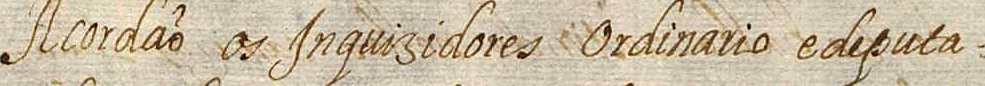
Acordaõ os Jnquizidores Ordinario e deputa
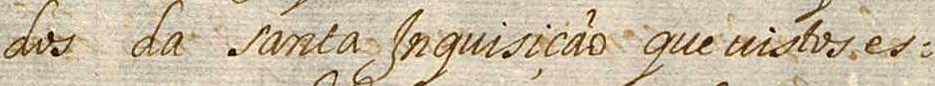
dos da santa Jnquisição que uistos estes
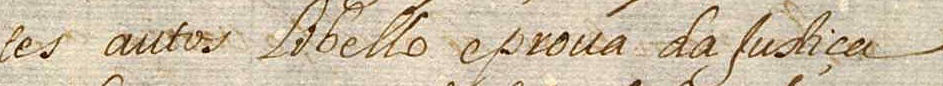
autos Libello e proua da Justiça
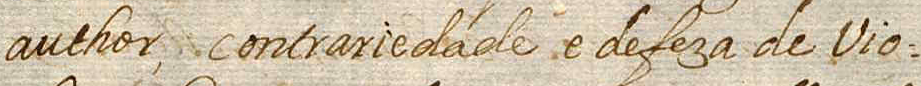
author, contrariedade e defeza de Vio
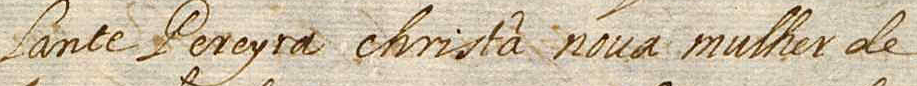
lante Pereyra christã noua mulher de
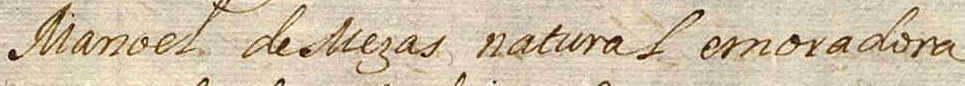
Manoel de Mezas natural e moradora
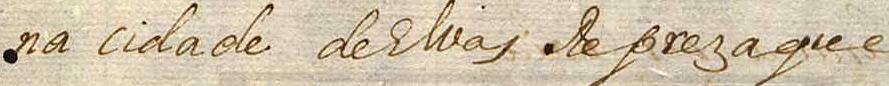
na cidade de Elvas Re preza que
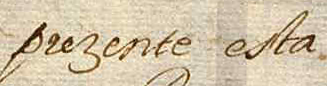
prezente esta
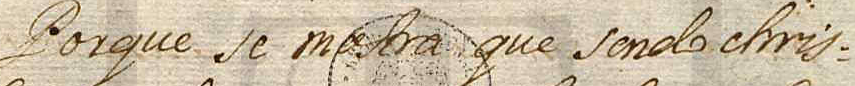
Porque se mostra que sendo chris
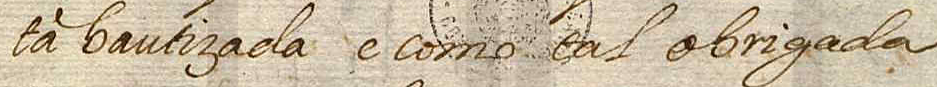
tã bautizada e como tal obrigada
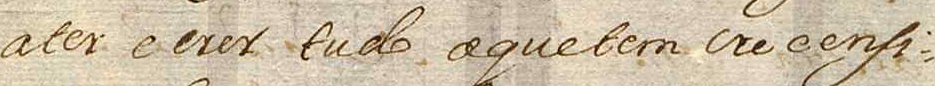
a ter e crer tudo o que tem cre e ensi
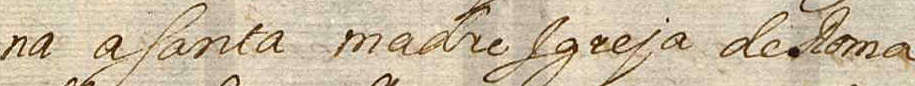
na a santa madre Jgreja de Roma
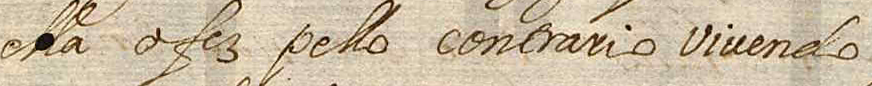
ella o fez pello contrario viuendo
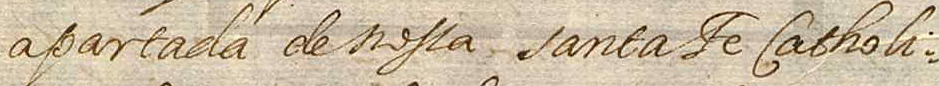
apartada de nossa santa Fe Catholi
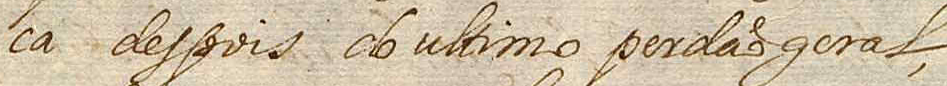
ca despois do ultimo perdaõ geral,
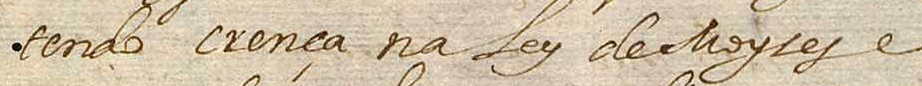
tendo crença na Ley de Moyses e
